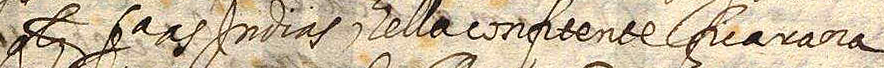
gl̄z ꝓa as Jndias, E ella confitente ficara na
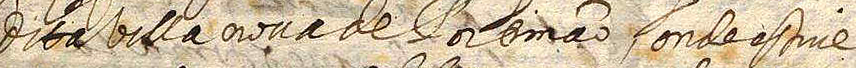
dita villa noua de Portimão, onde estiue
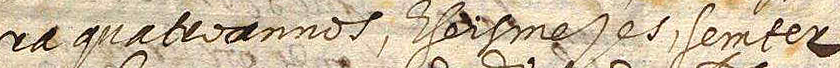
ra quatro annos, E seis meses, sem ter
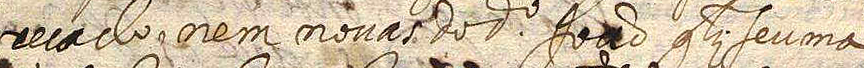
recado, nem nouas do d.o João gl̄z seu ma
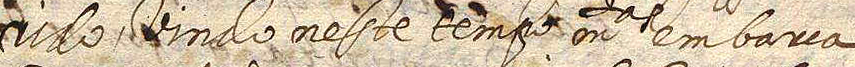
rido, Vindo neste tempo mtas embarca
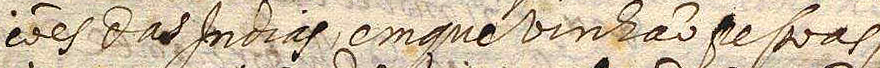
ções das Jndias, em que vinhaõ pessoas,
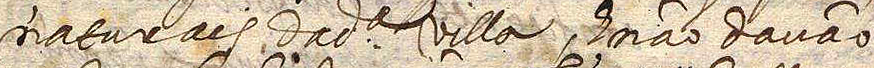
naturais da d.a villa, E não dauão
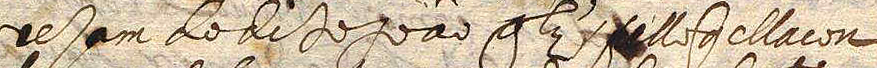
resam do dito joão gl̄z, pello q̄ ella con
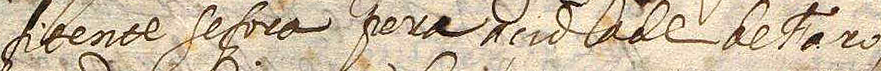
fitente se fora pera a çidade de Faro,
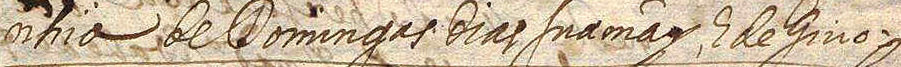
nhia de Domingas dias sua mãj, E de Guio
